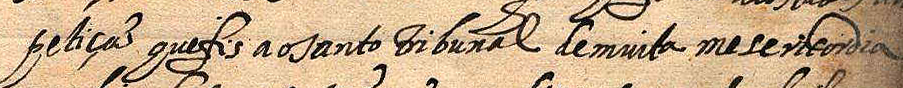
petiçaõ que fis ao santo tribunal de muita mesericordia
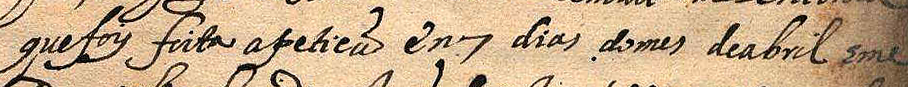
que foy feita a petiçaõ e nos dias do mes de abril E me
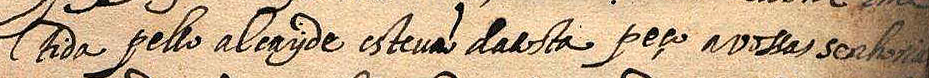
tida pello alcayde esteuaõ da costa peço a vossas senhoria
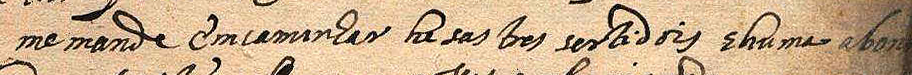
me mande emcaminhar hesas tres sertidois E huma a bom
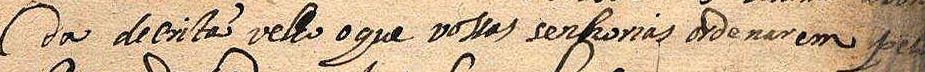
da de cristaõ velho o que vossas senhorias ordenarem pelo
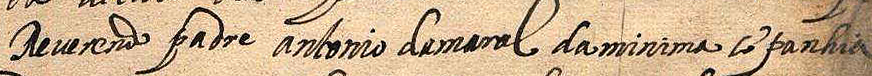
Reuerendo padre antonio damaral da minima cōpanhia
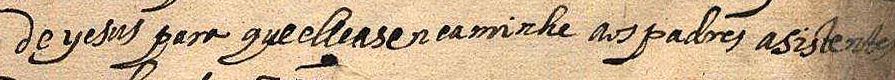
de yesus para que elle as encaminhe aos padres asistentes
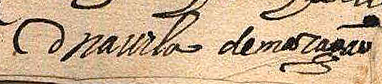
d na uila de mazagão
